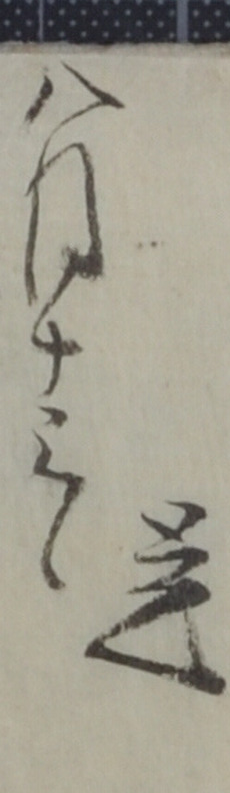八月十三日
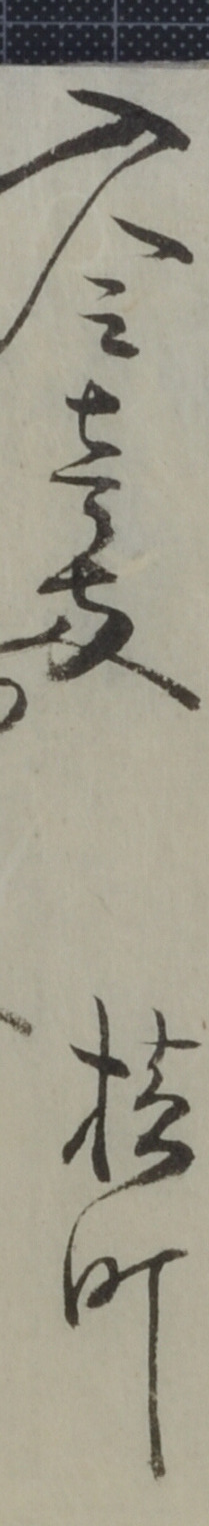入金壱両横町
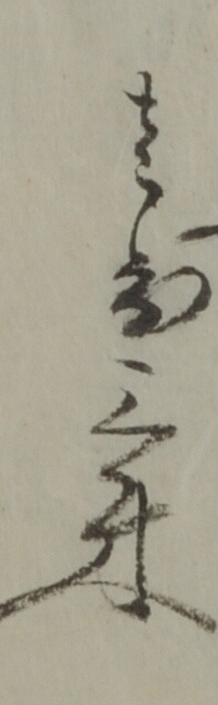壱分三朱
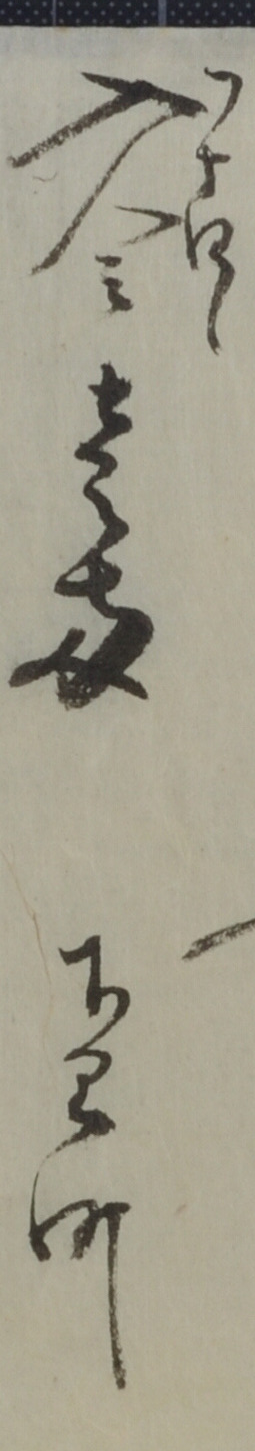入金壱両下里町
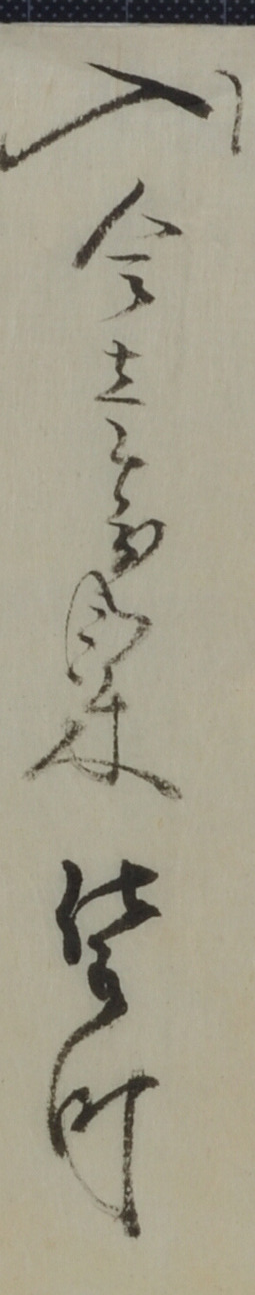入金壱両弐朱新町
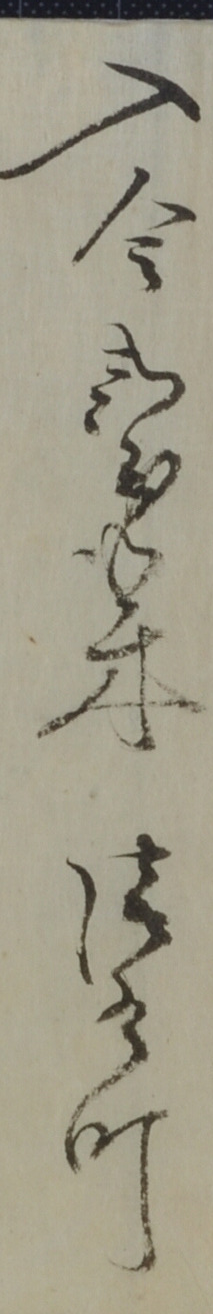入金弐両弐朱清水町
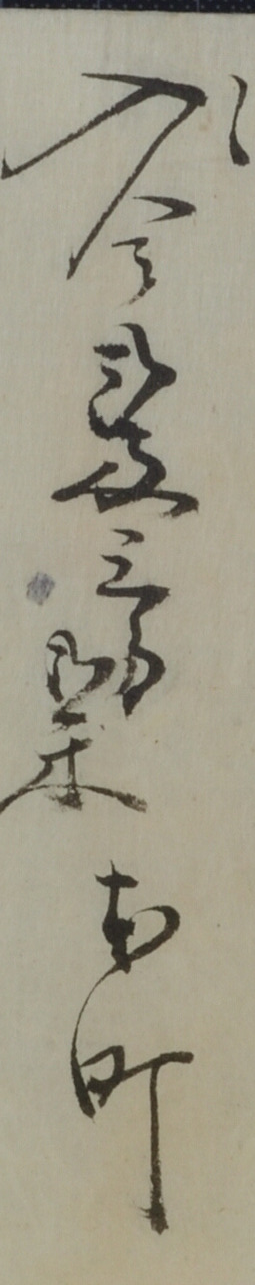入金弐両三分本町
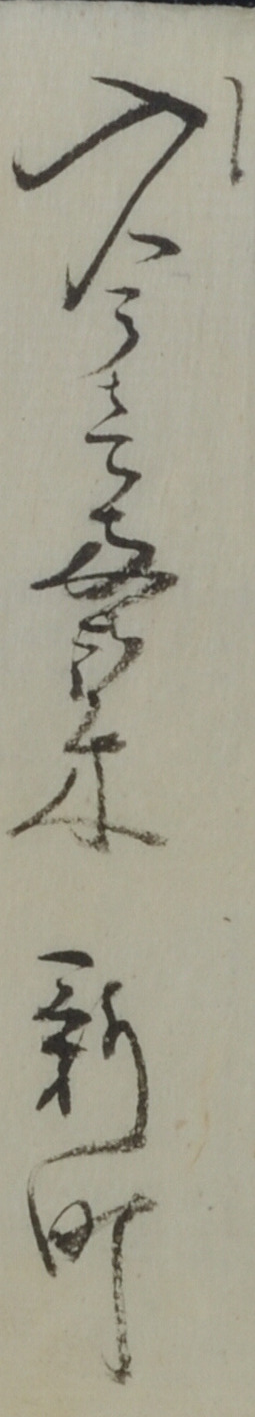入金壱両弐朱新町
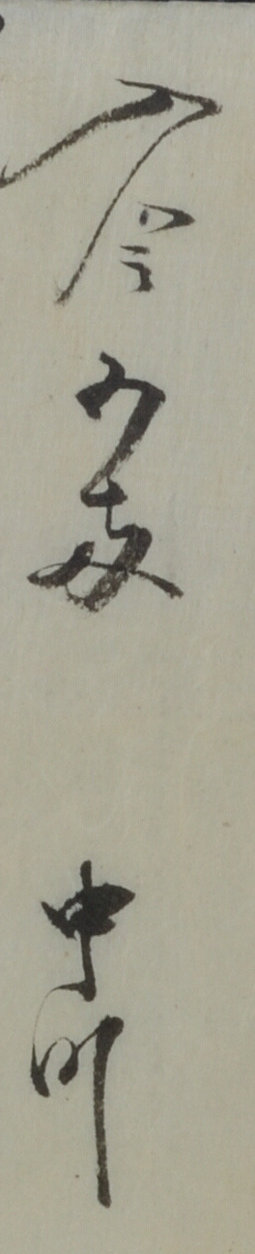入金五両中町

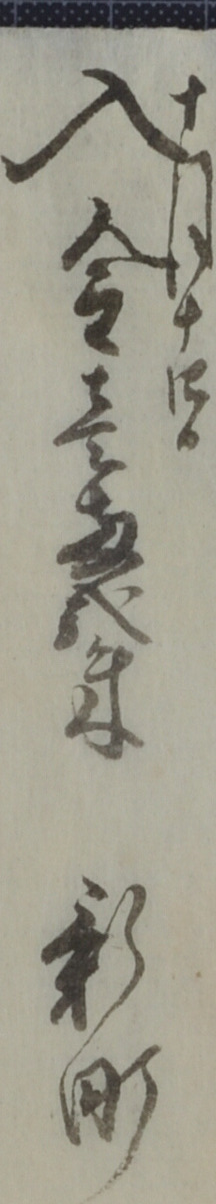入金壱両弐朱新町
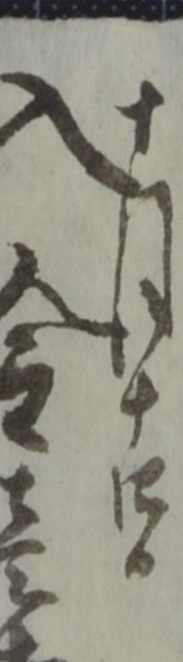十月十四日
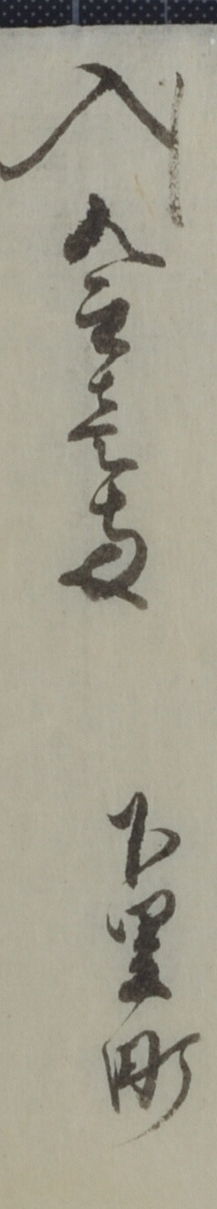入金壱両下里町
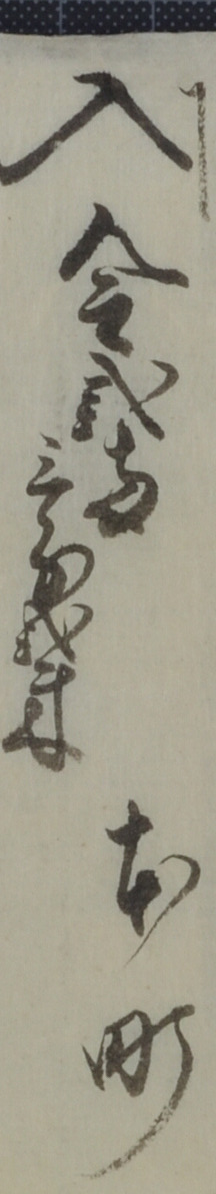入金壱両弐朱新町
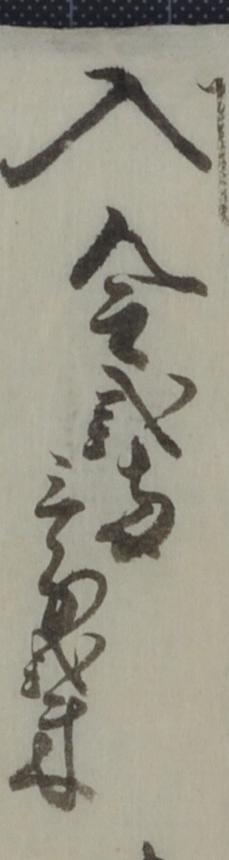入金弐両本町
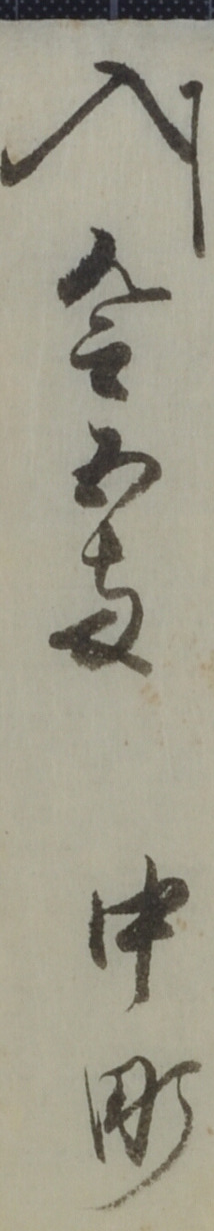入金五両中町
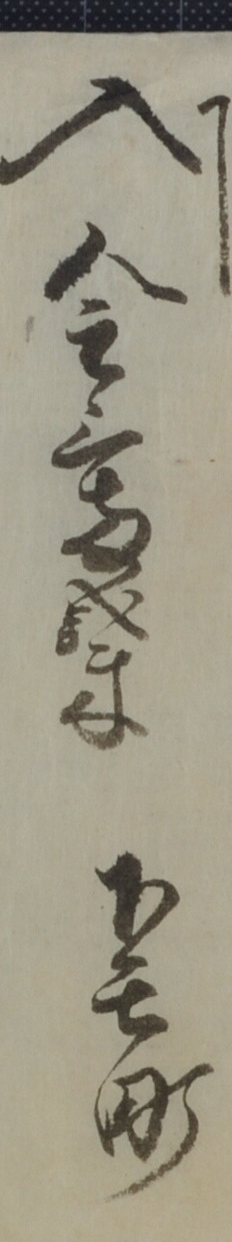入金三両弐朱下モ町
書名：江戸御上屋鋪御類焼ニ付拾町より献金取集帳
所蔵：伊那市立高遠町図書館・合同会社AMANE
